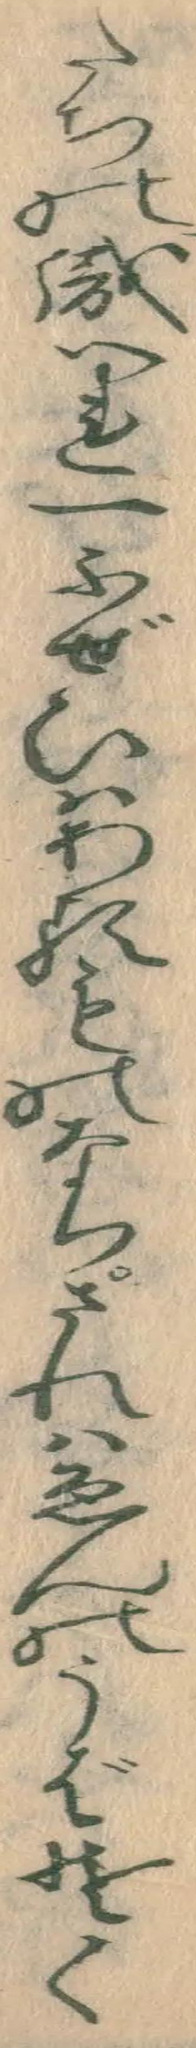たちの織いれ一ふぜひはあるものなり。されはゑんのうばそく
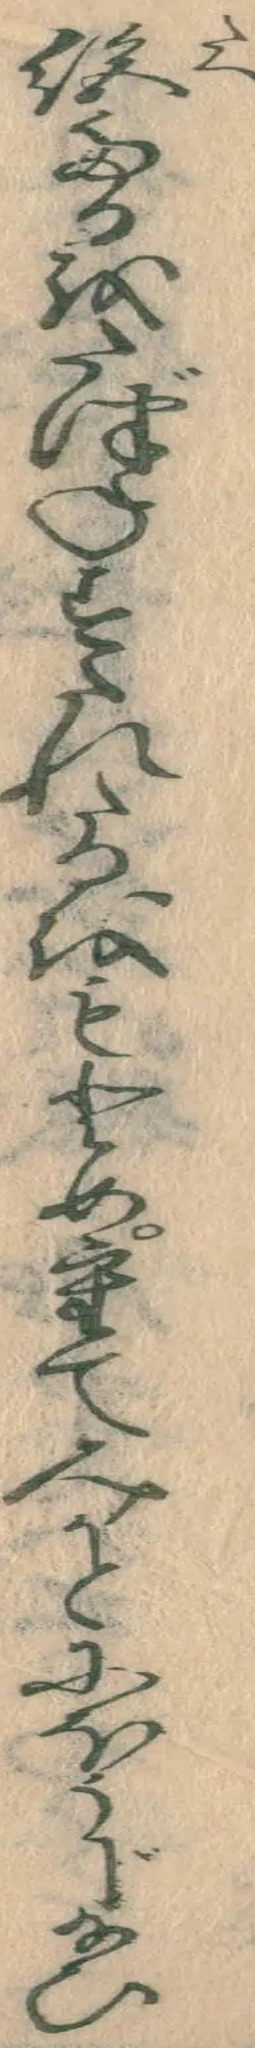絶たるをたづねすたれたるをもとめ。重てみかとにほうじ給ひ
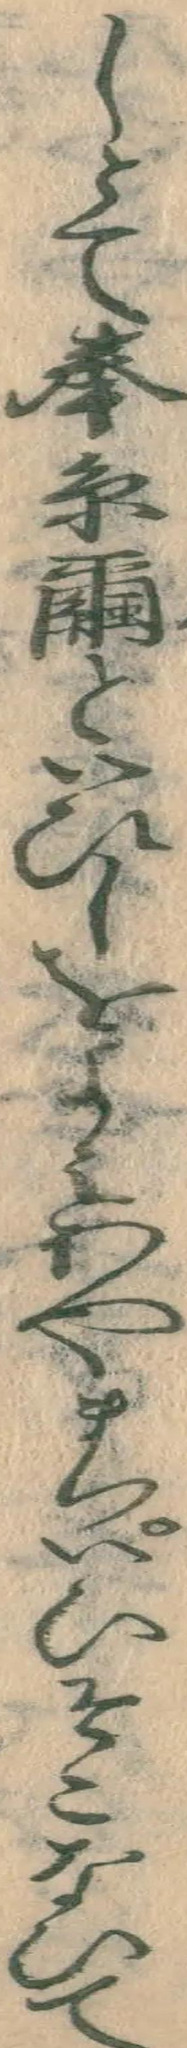しとて奉糸繭といひしをよみあやまり。いひそこなひて
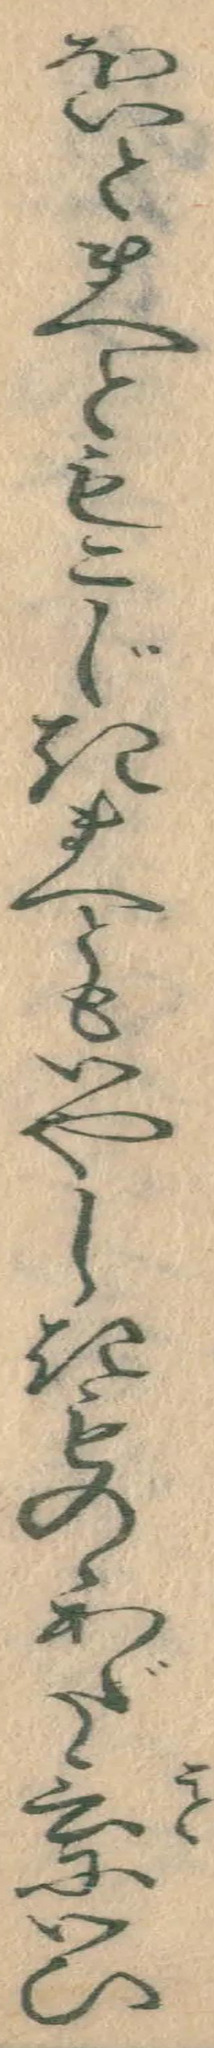ほいとまへともこじきまへともいやしきものゝあだ言にいひ
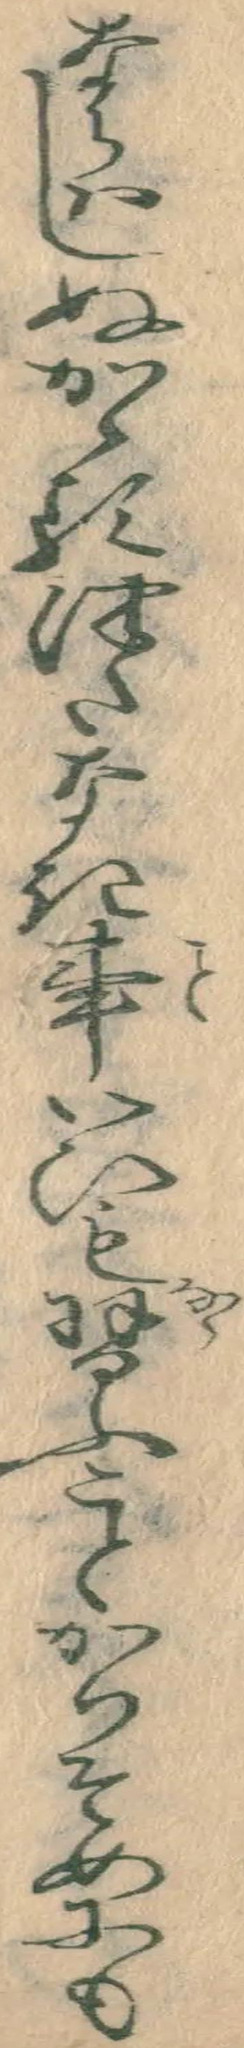ならはしぬかゝるつたなき事いひも習ふことかりそめにも
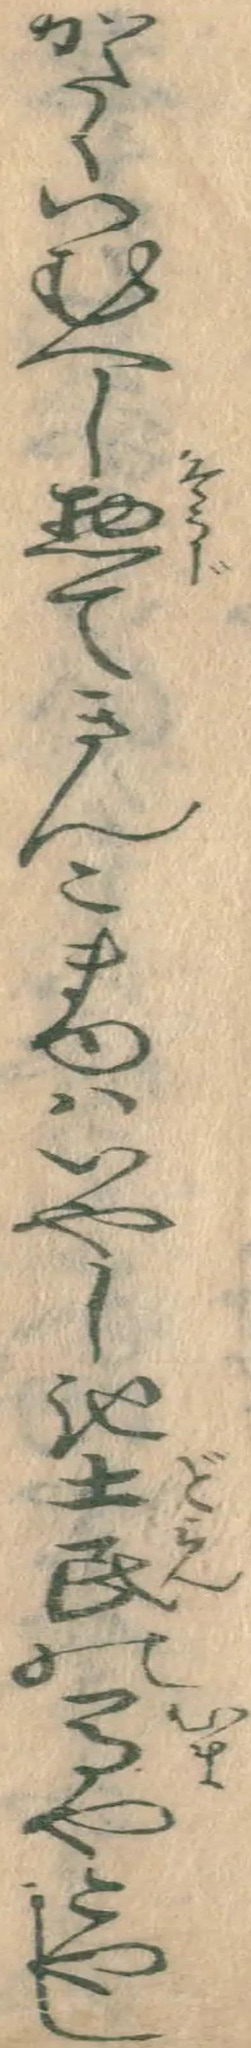かたくいむへし惣てきんこまゆはいやしき土民の馬やこやし
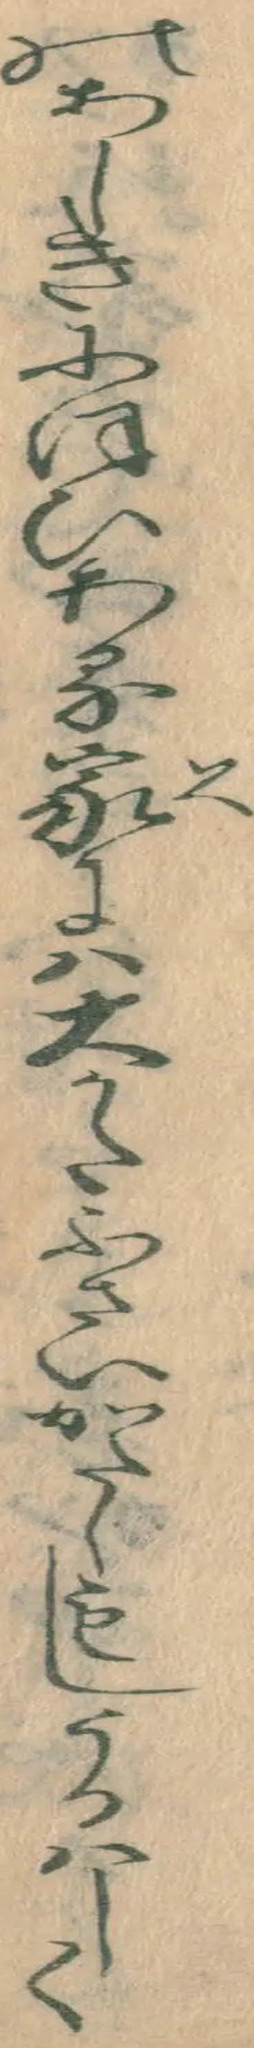のあしきにほひある家には大かたふさいかたしもしうるはしく

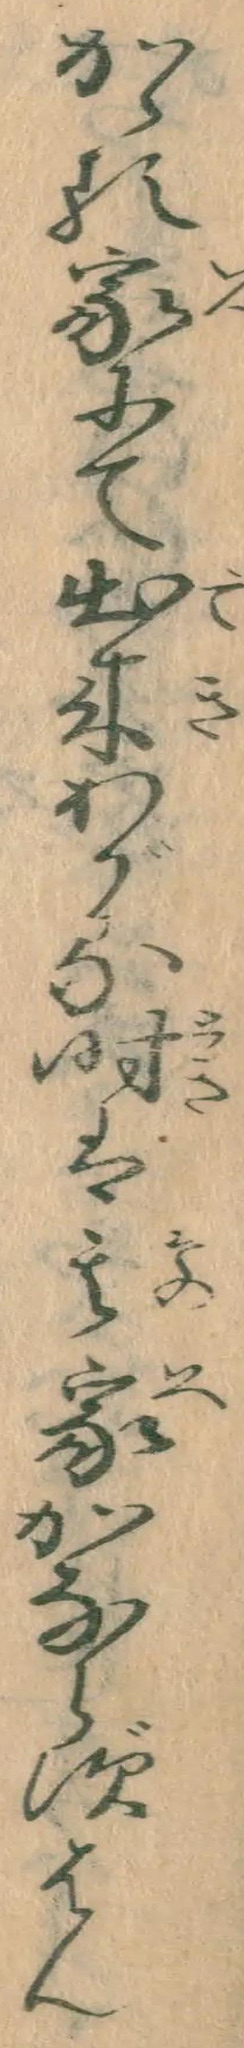かゝる家にて出来あがる時は其家かならずはん
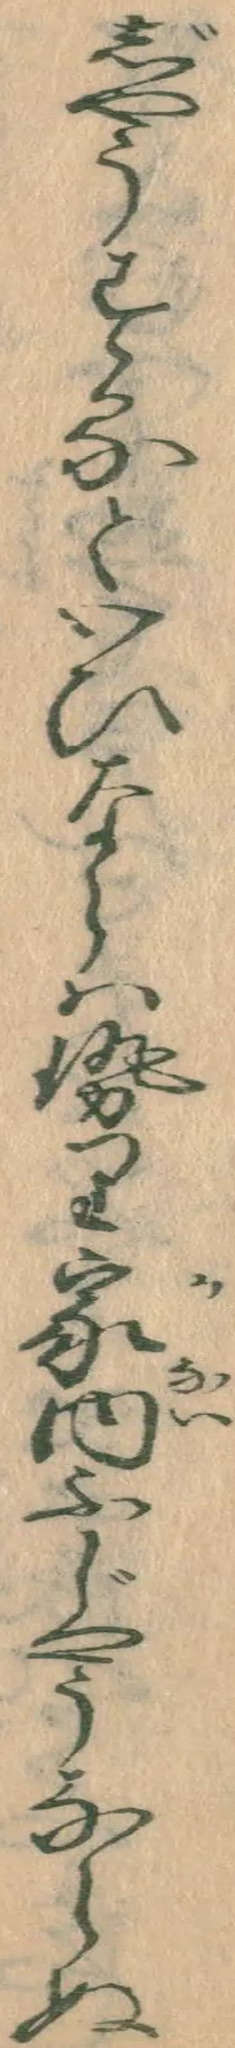じやうするといひならはせり家内ふじやうならぬ
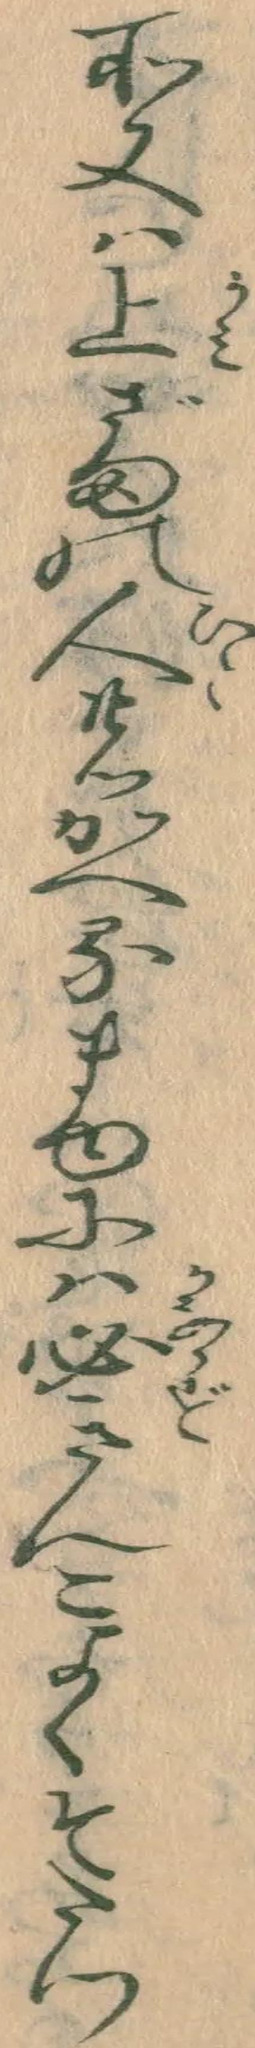所又は上ざまの人のかへるまゆには必きんこよくそたつ
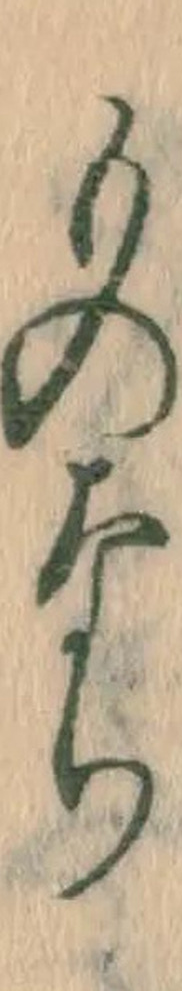ものなり
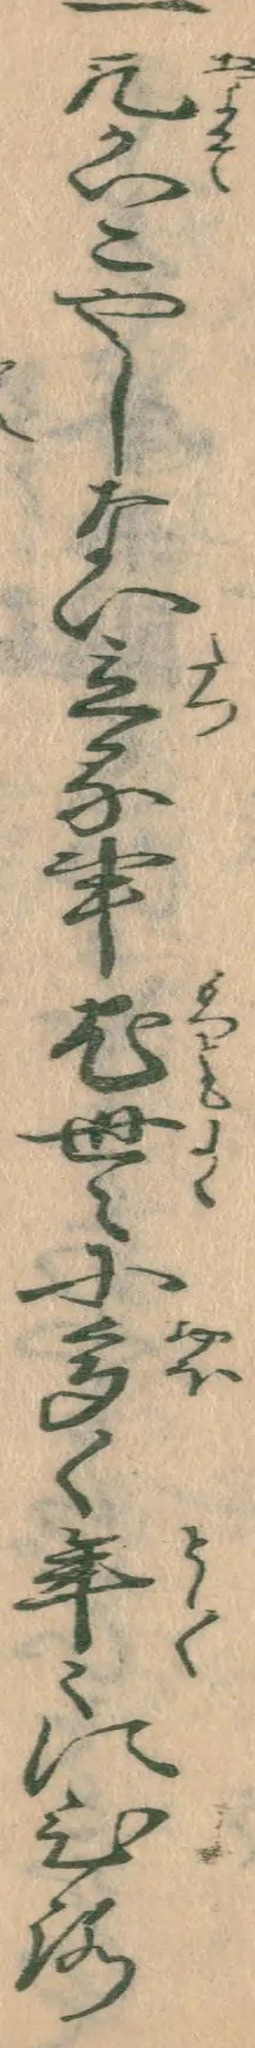一凡かいこやしない立る事尤世々に多く年々にひろ
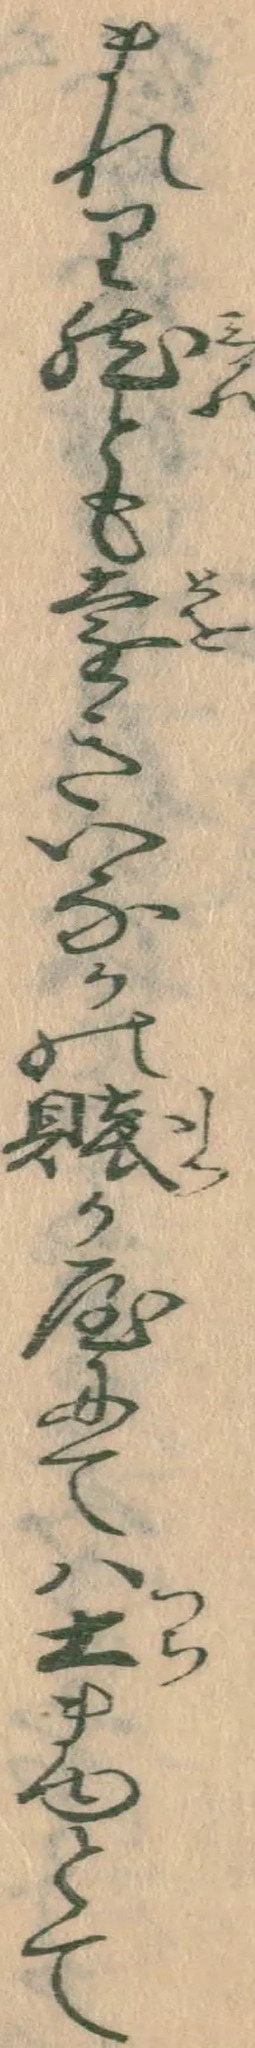まれり然とも遠きいなかの賤か屋にては土まゆとて
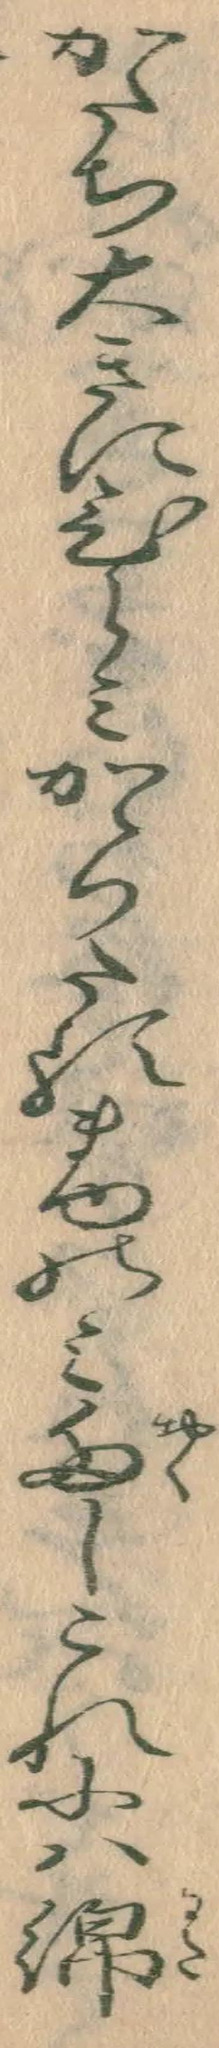かたち大きにひらみかゝりたるまゆのみ多しこれには綿
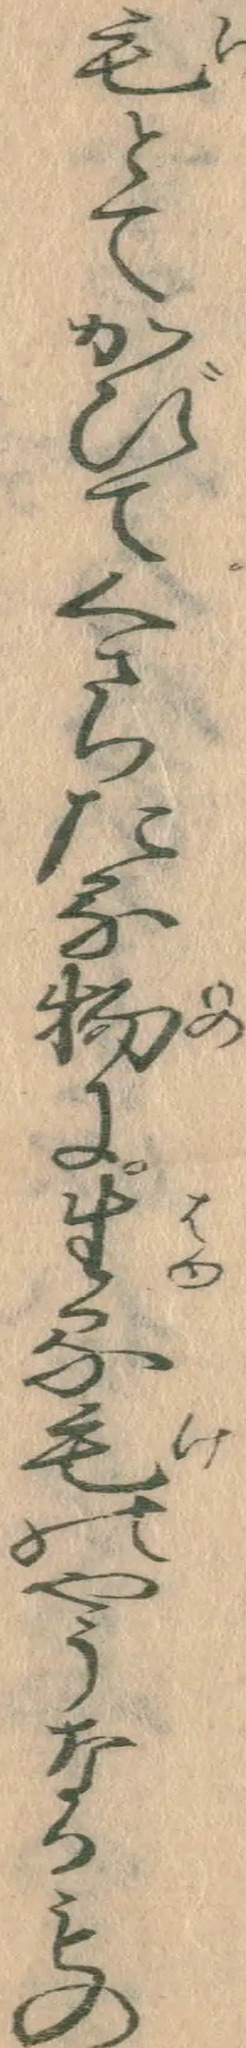毛とてかびてくさりたる物に。生る毛のやうなるもの
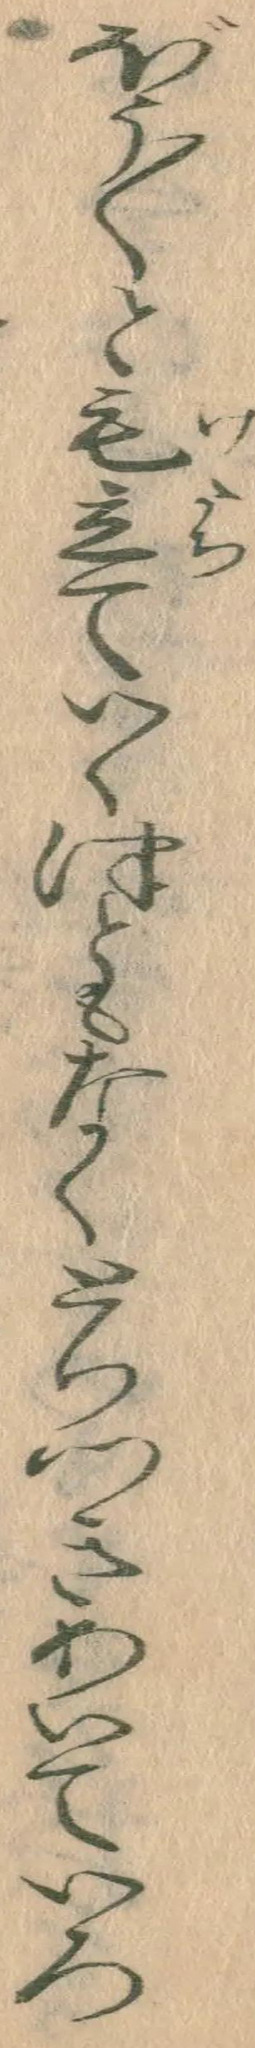ぼう〳〵と毛立ていくつともなくとりつきあいていろ
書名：蚕飼養法記
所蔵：国立国会図書館 National Diet Library, JAPAN
